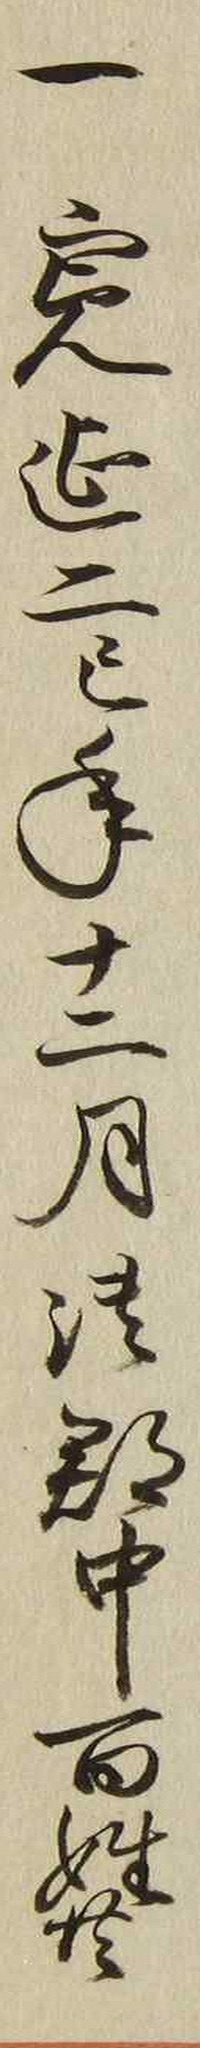一寛延二巳年十二月御郡中百姓共
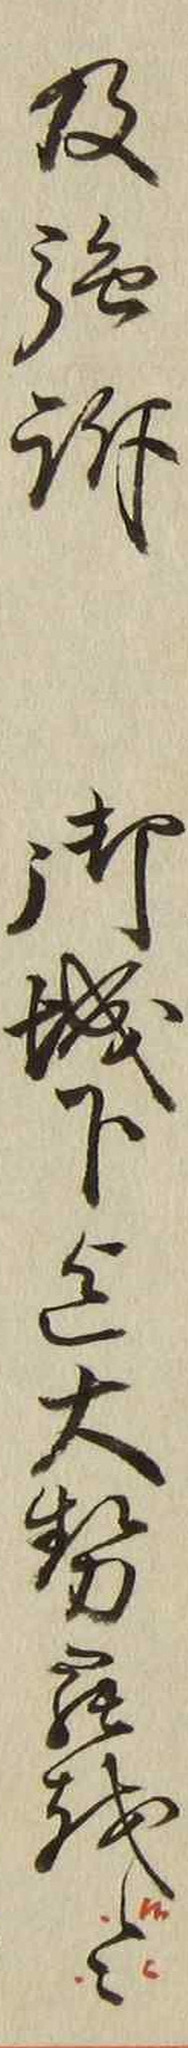及強訴御城下迄大勢罷越候ニ
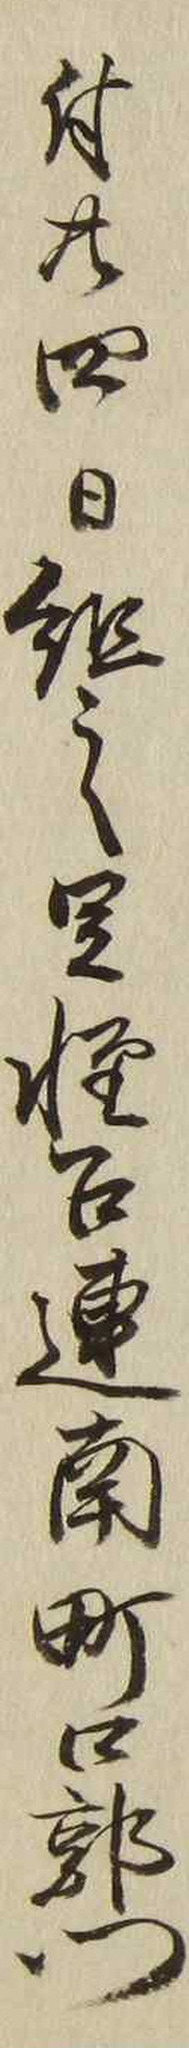付廿四日組之足軽召連南町口郭門

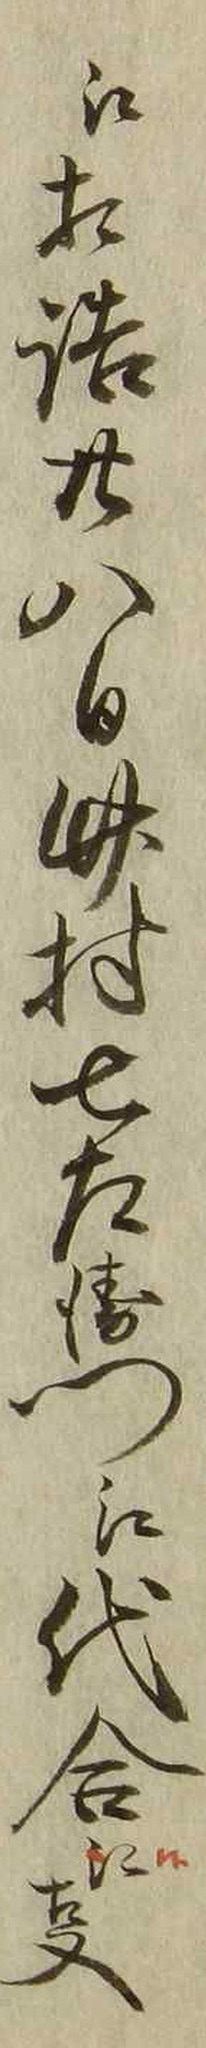江相詰廿八日竹村七左衛門江代合候事
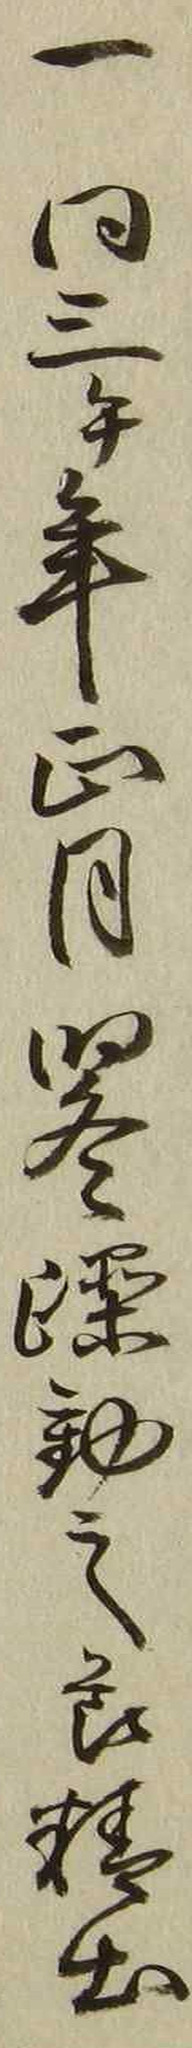一同三午年正月旧冬躁動之節精出
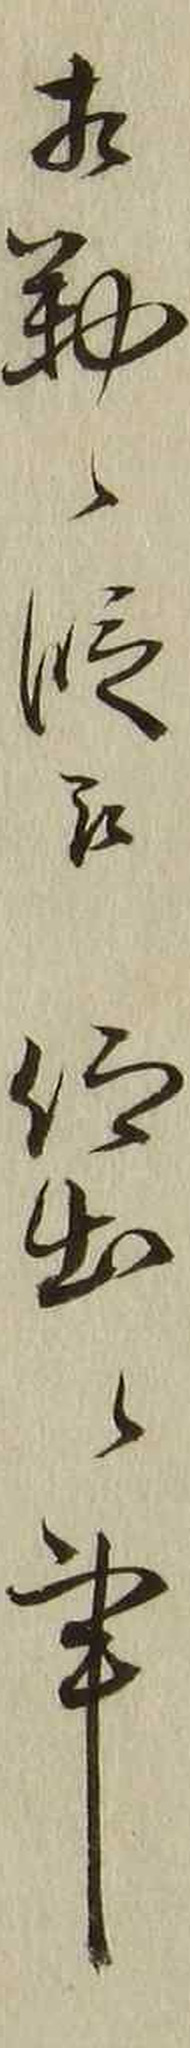相勤候段被仰出候事
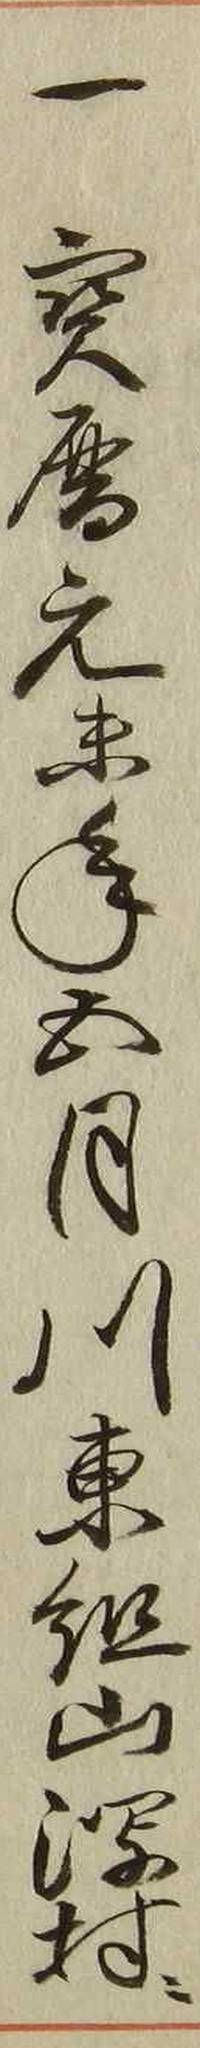一宝暦元未年五月川東組山潟村ニ
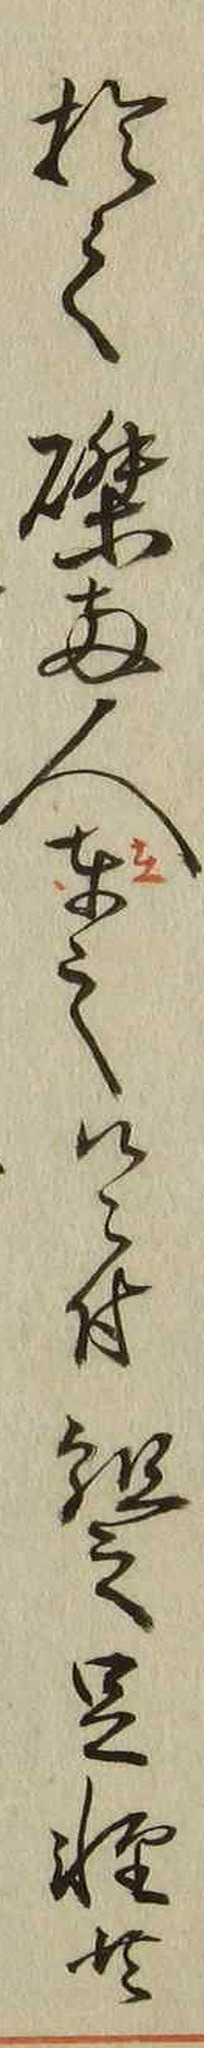於いて磔両人在之候ニ付組之足軽共
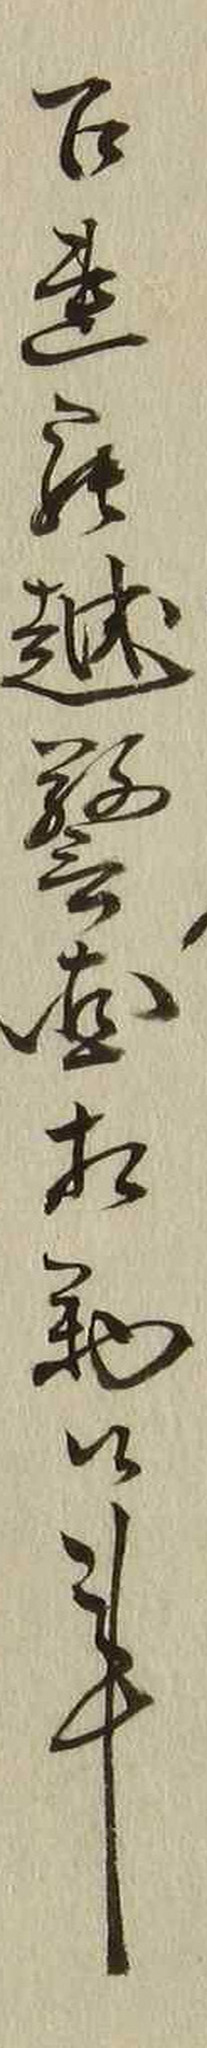召連罷越警固相勤候事
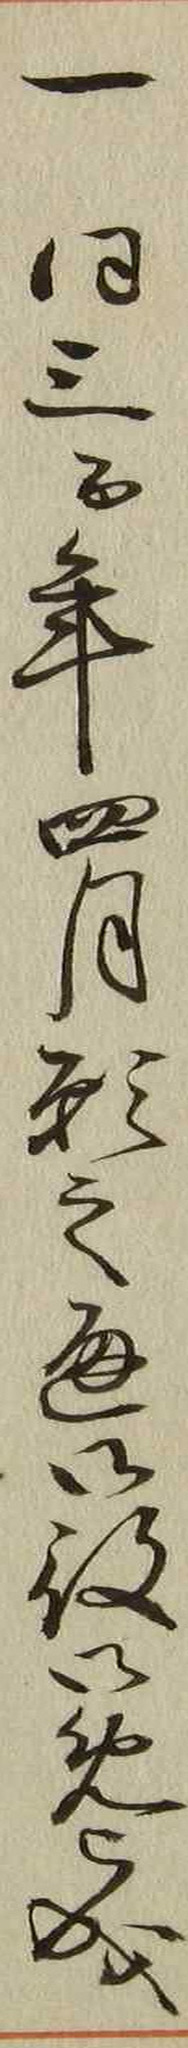一同三酉年四月願之通御役御免被成
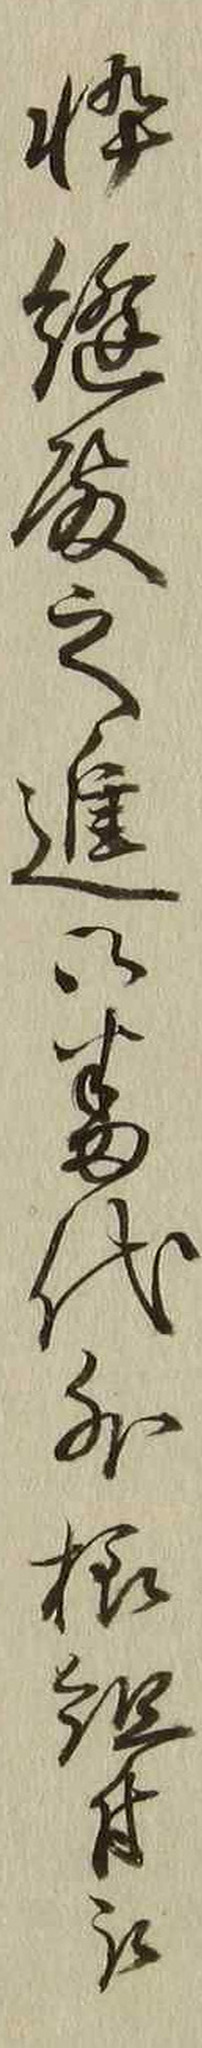忰縫殿之進御番代外様組付被
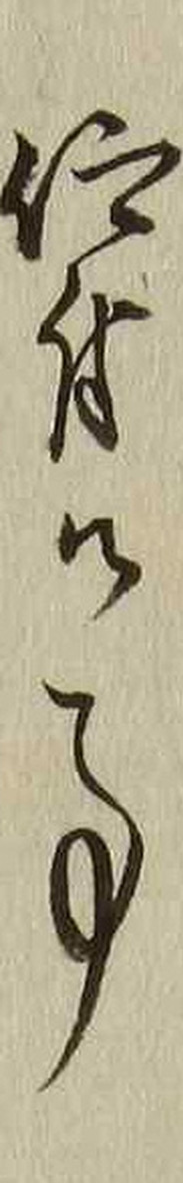仰付候事
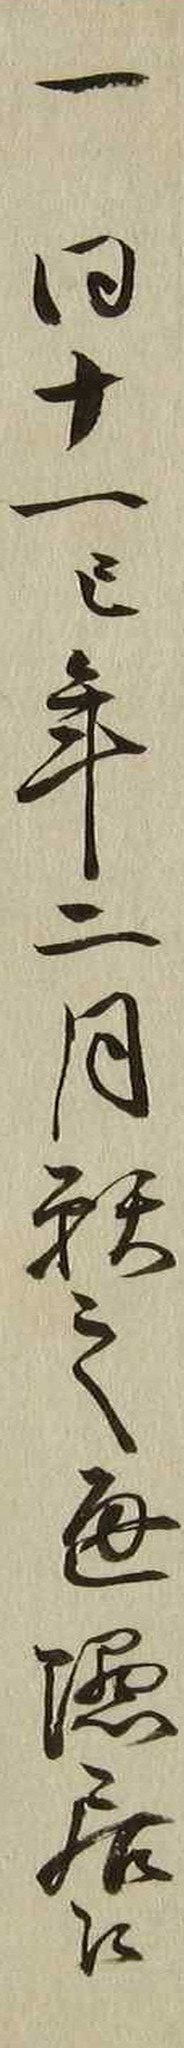一同十一巳年二月願之通隠居被
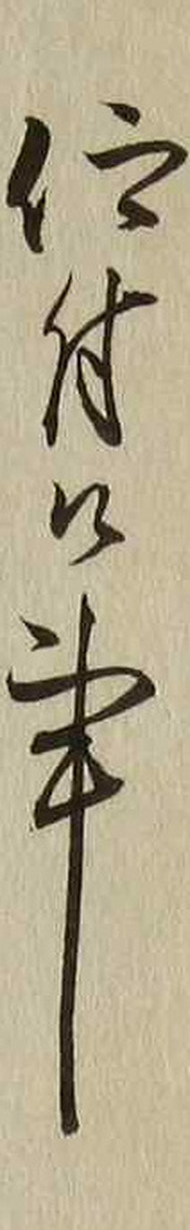仰付候事
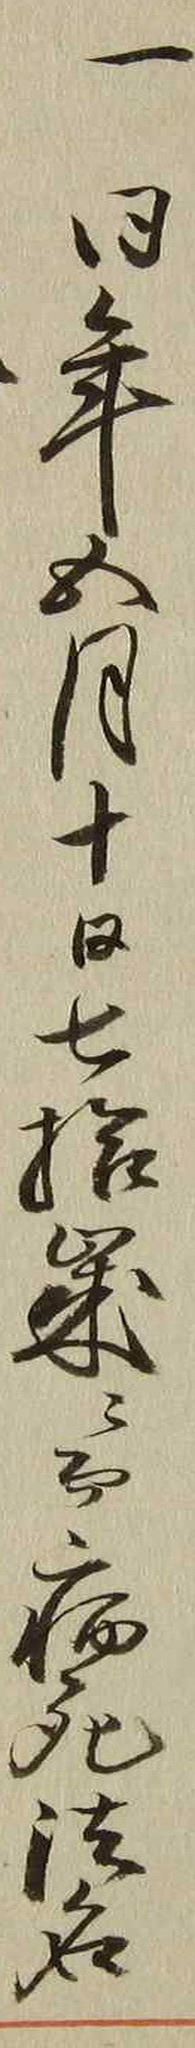一同年五月十日七十歳ニ而病死法名
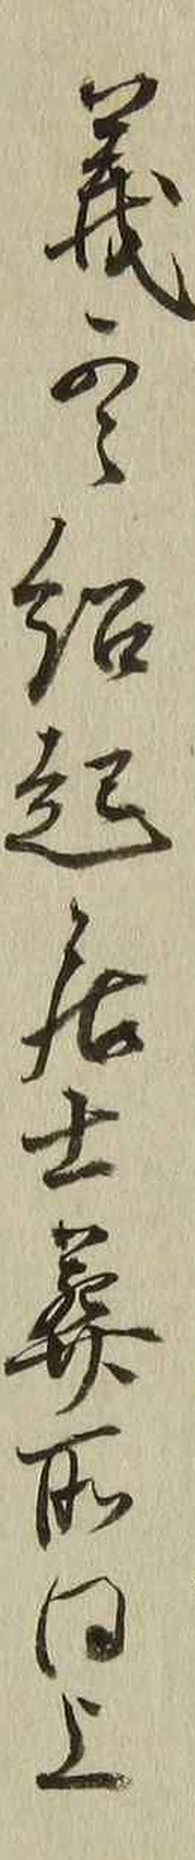義登紹起居士葬所同上
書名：諸士系譜　巻之60　と之部3
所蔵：会津若松市立会津図書館
